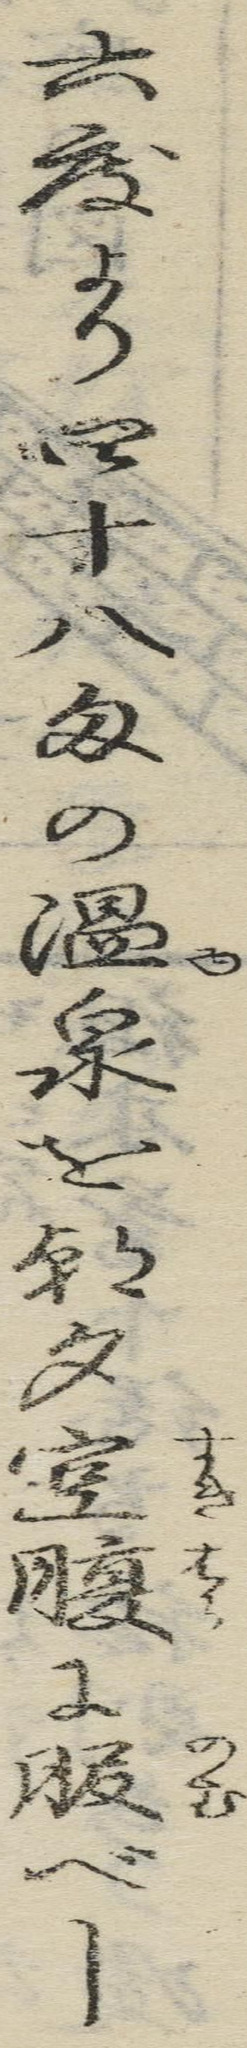六度より四十八匁の温泉を朝夕空腹に服べし
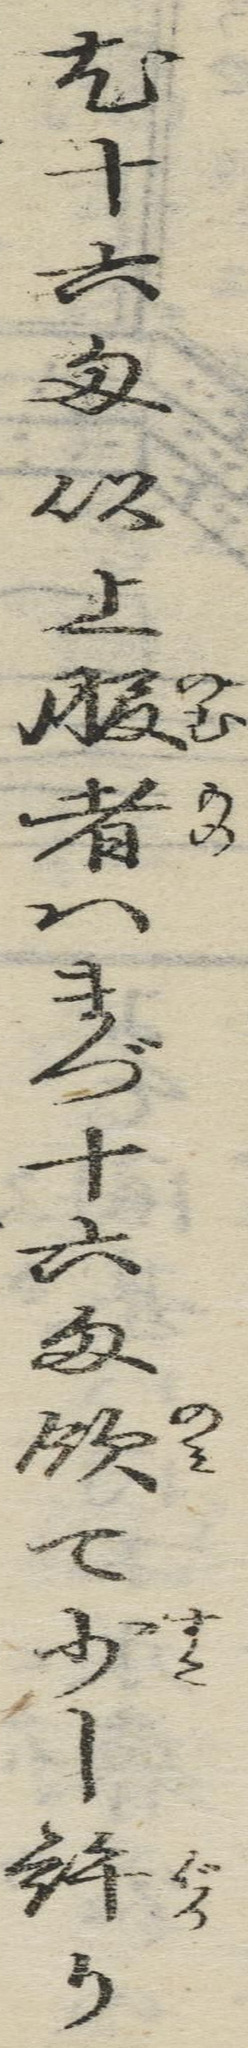尤十六匁以上服者はまづ十六匁飲て少し計り
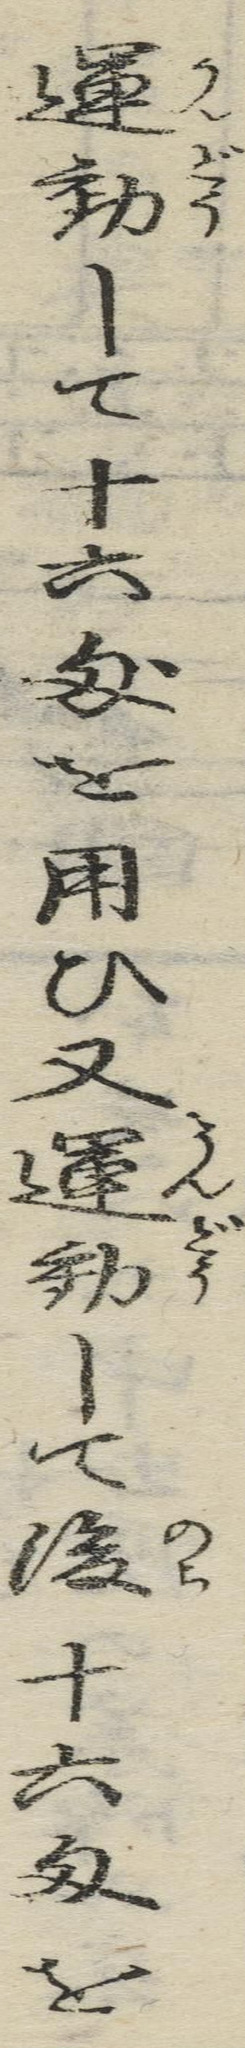運動して十六匁を用ひ又運動して後十六匁を
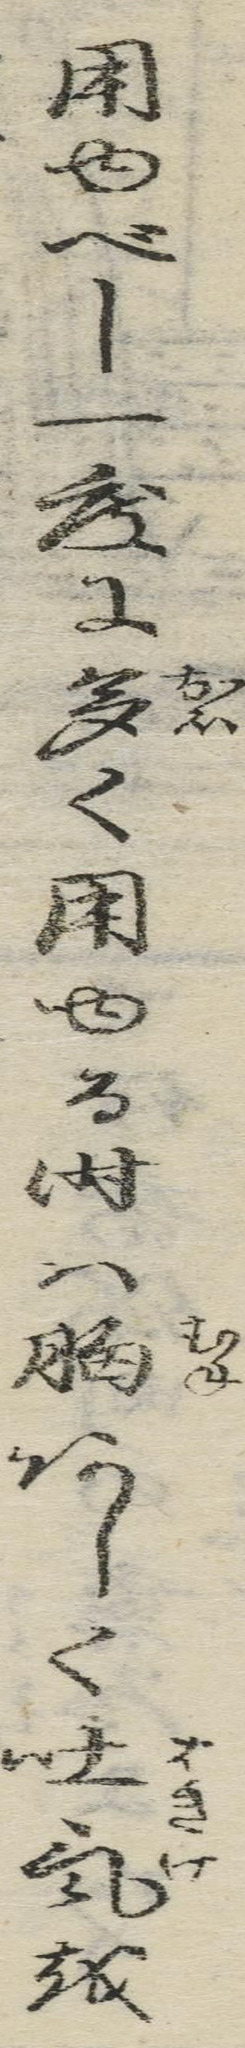用ゆべし一度に多く用ゆる時は胸あしく吐気を
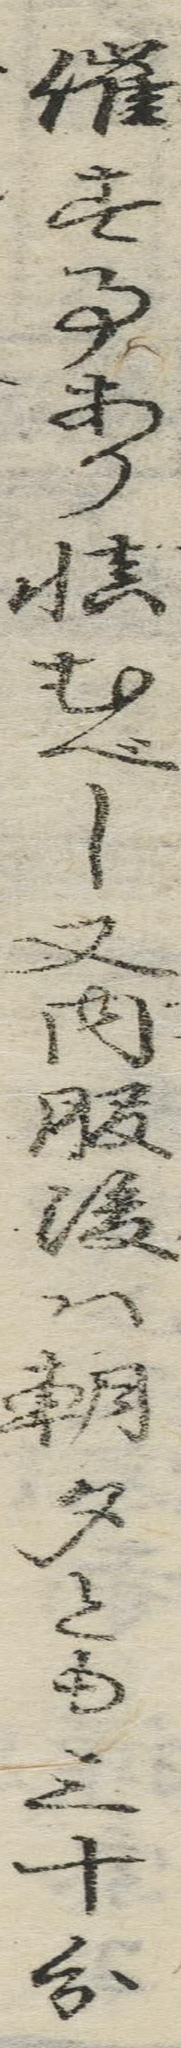催す事あり慎むべし又内服後は朝夕とも三十分
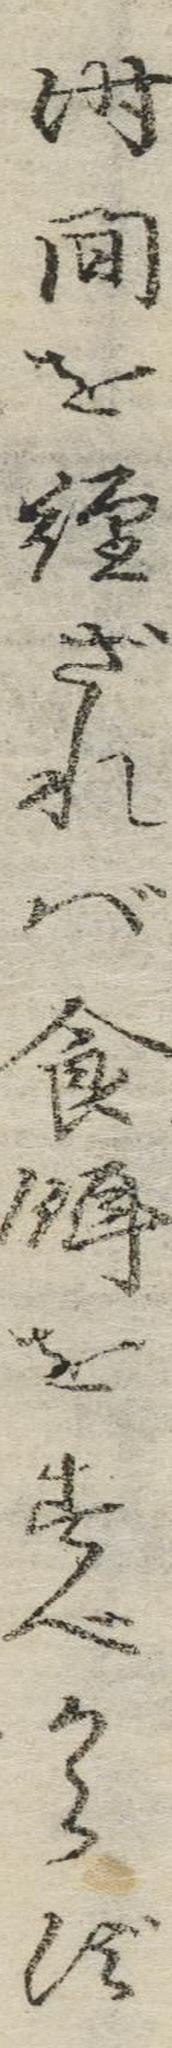時間を経ざれば食餌をすべからず
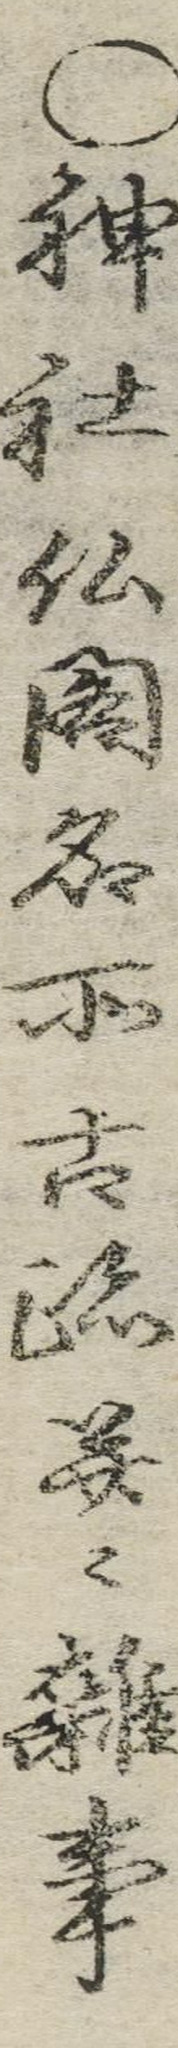○神社仏閣名所古跡等々の雑事
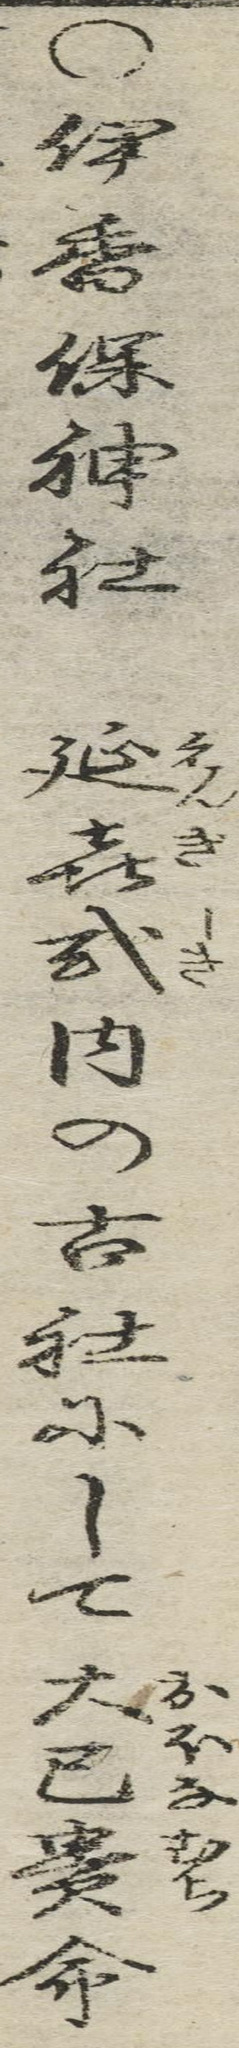○伊香保神社延喜式内の古社にして大巳貴命
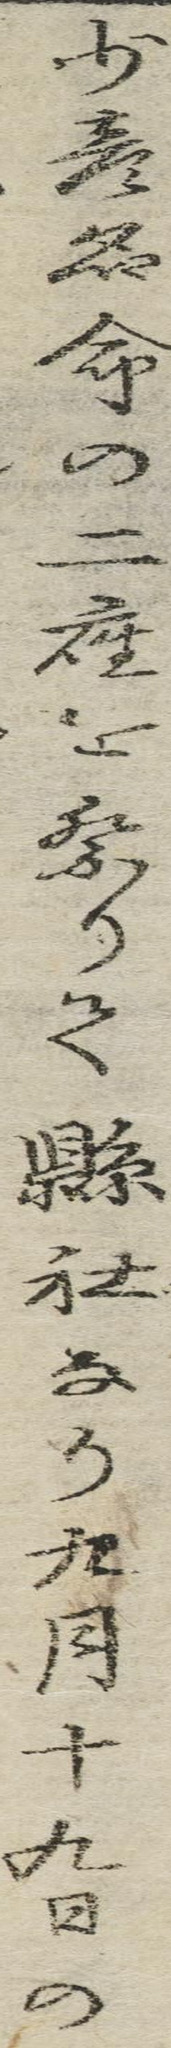少彦名命の二座を祭りて県社なり九月十九日の
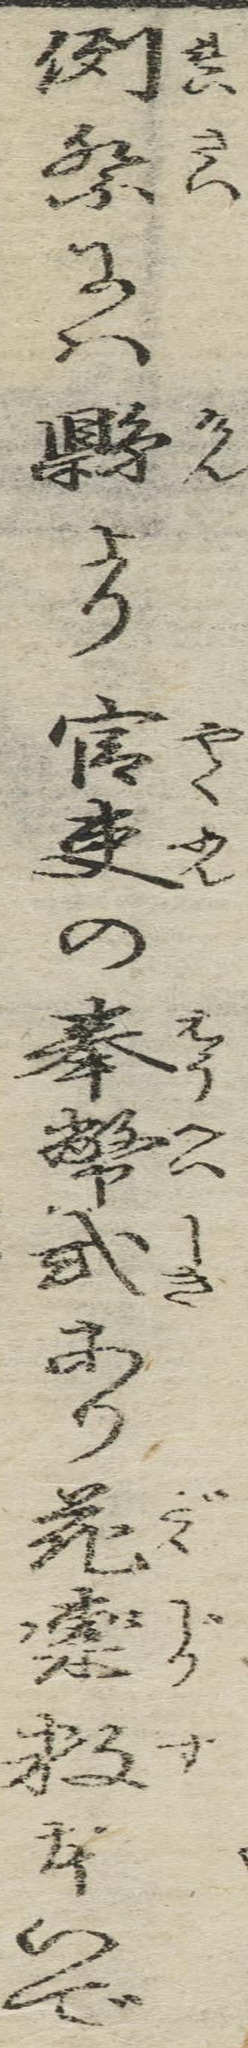例祭には県より官吏の奉幣式あり花輿数本いで
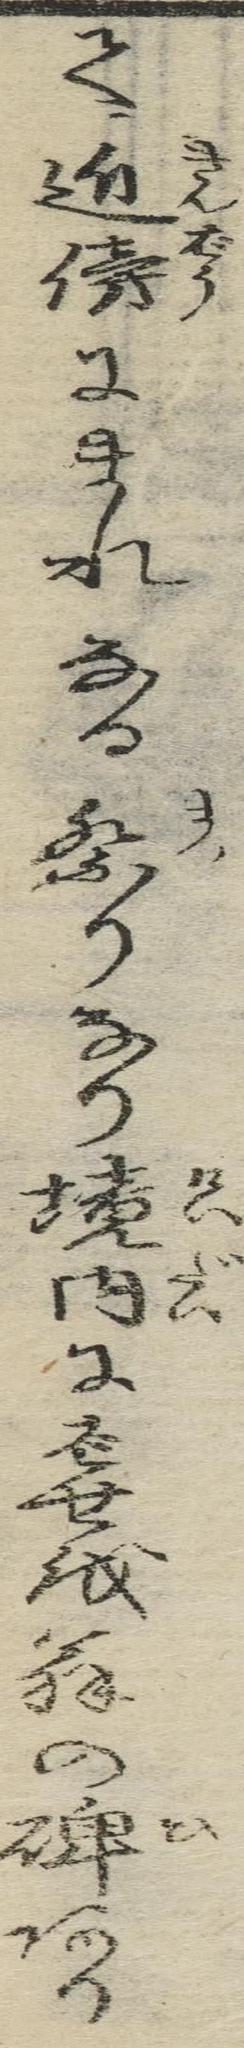て近傍にまれなる祭りなり境内にはせを翁の碑あり

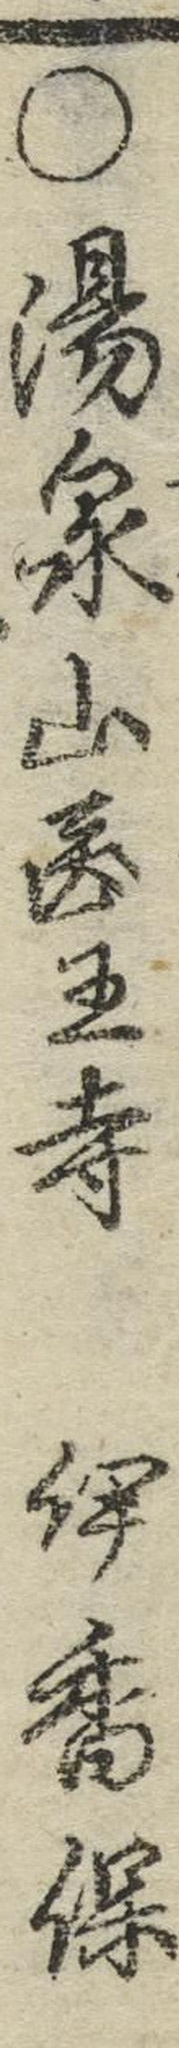○湯泉山医王寺伊香保
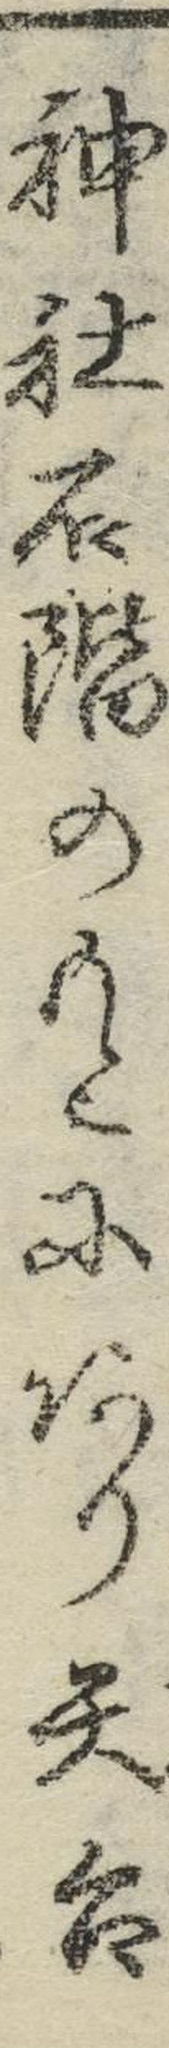神社石階のもとにあり天台
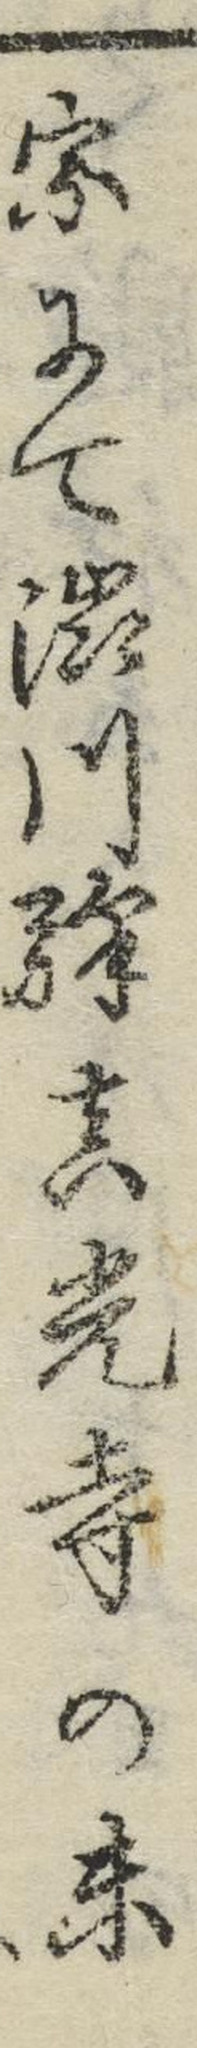宗にて渋川驛真光寺の末
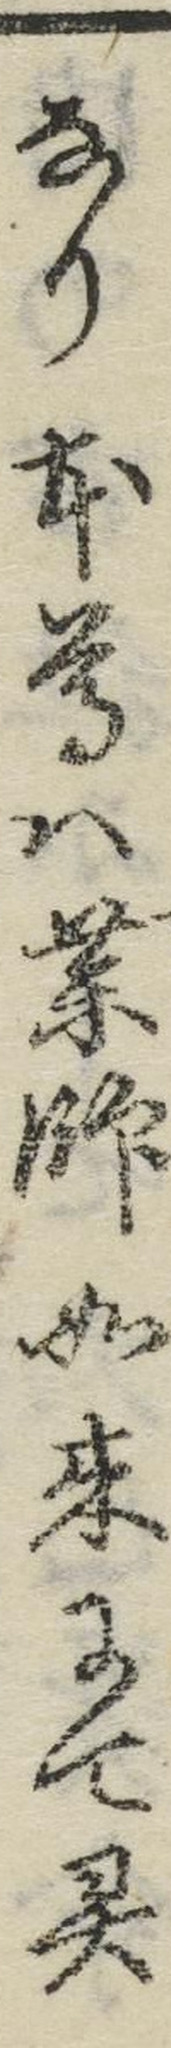なり本尊は薬師如来にて異
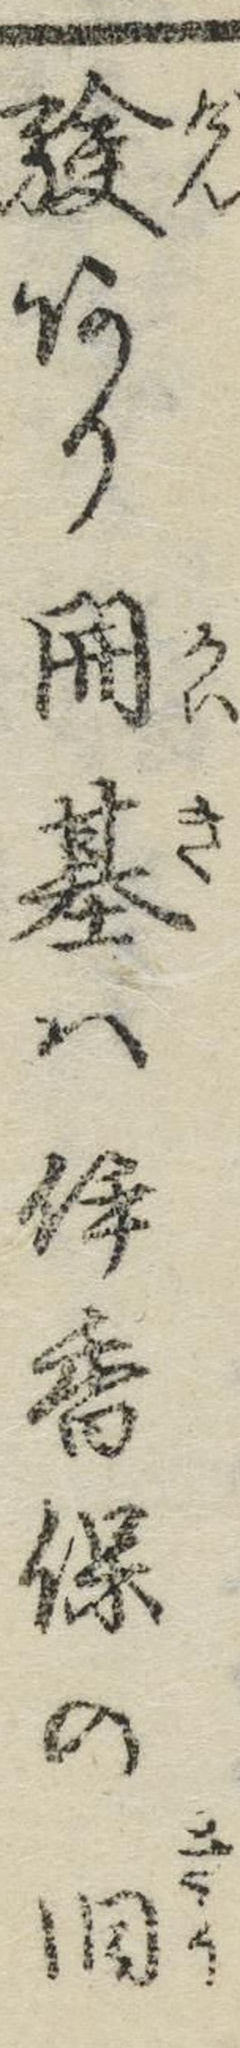験なり開基は伊香保の旧
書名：上州伊香保鑛泉圖會　全
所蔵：東京大学地震研究所図書室 Earthquake Research Institute Library, The University of Tokyo, JAPAN
